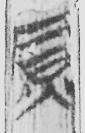庶
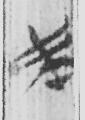民
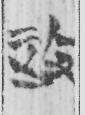政
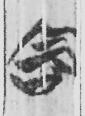令
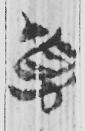惪
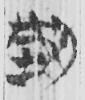型
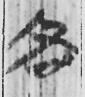各
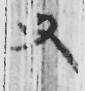又
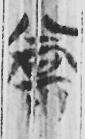常
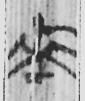𠂔
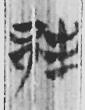邦
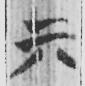亓
